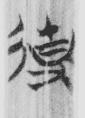𫹒
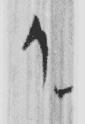人
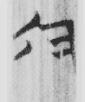今
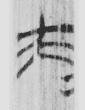夫=
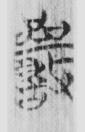嚴
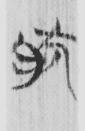肰
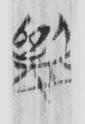監
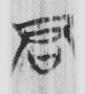君
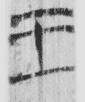王
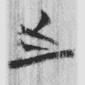之
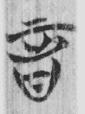音
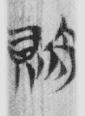賜
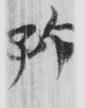孤
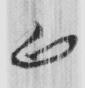㠯（以）
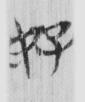好
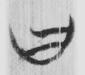曰
